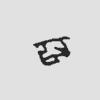取
